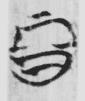{几日}
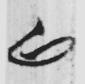㠯（以）
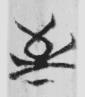至
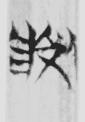{爿死}
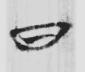日
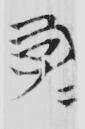乳=
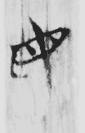母
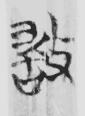敢
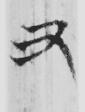又
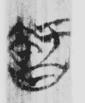智
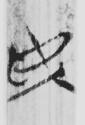𡚦
